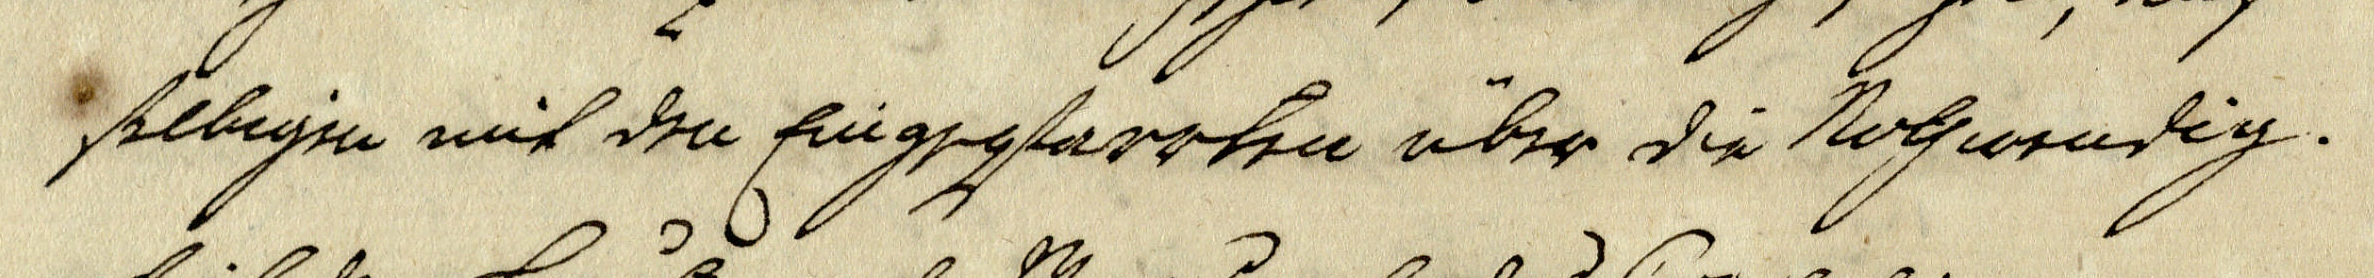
selbigen mit den Eingepfarrten über die Nothwendig¬
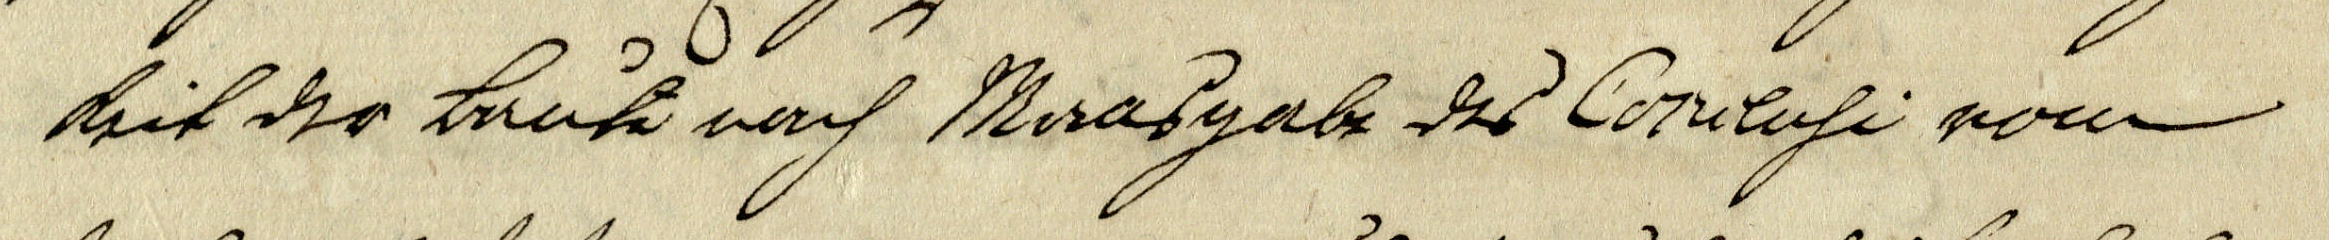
keit der Baute nach Maasgabe des Conclusi vom
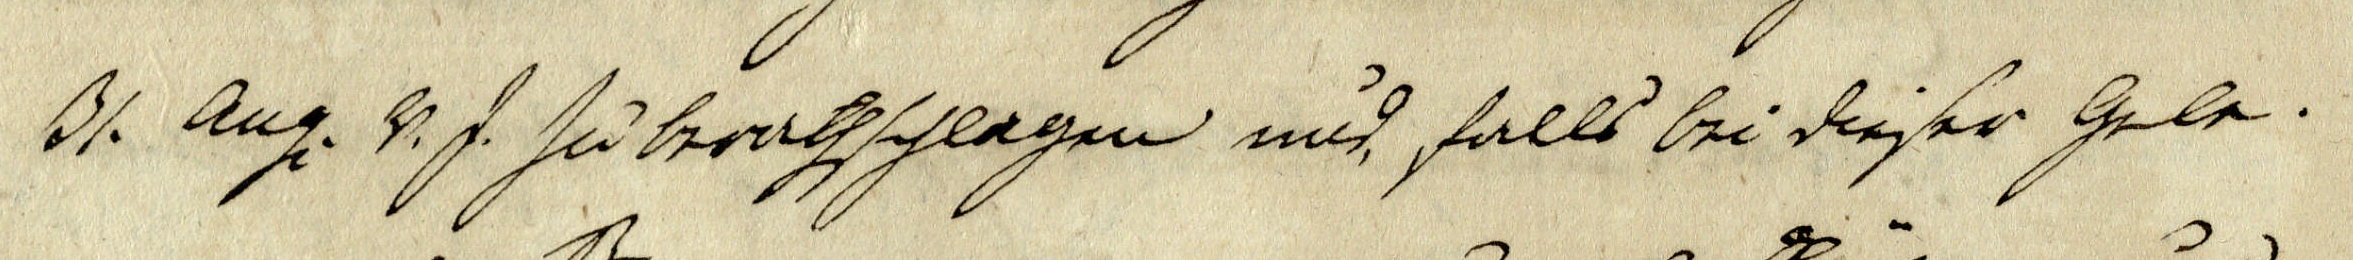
31. Aug. v. J. zu berathschlagen und, falls bei dieser Gele¬
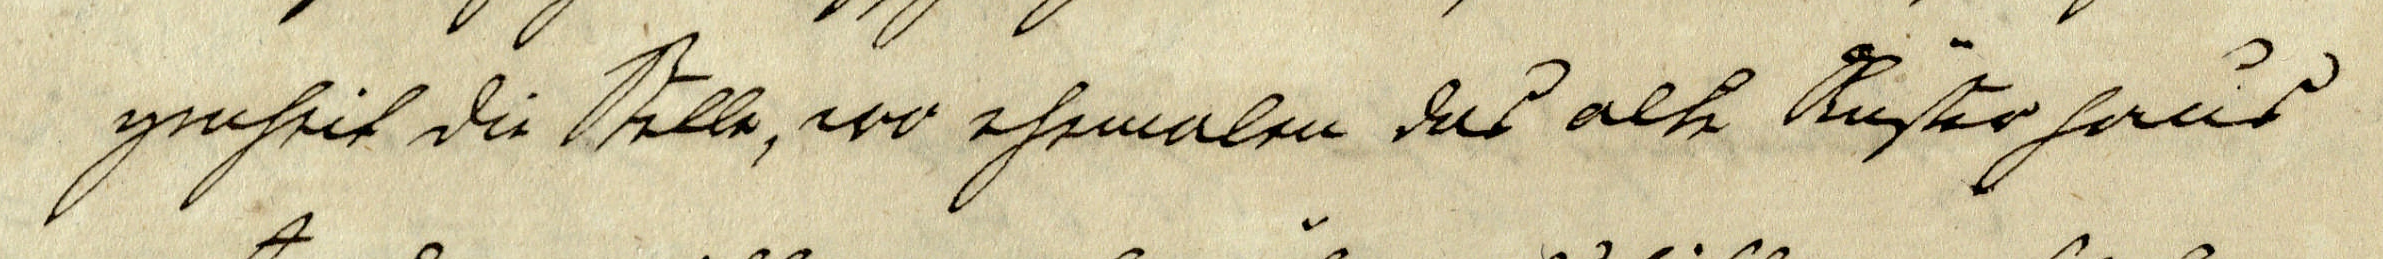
genheit die Stelle, wo ehemalen das alte Küsterhaus
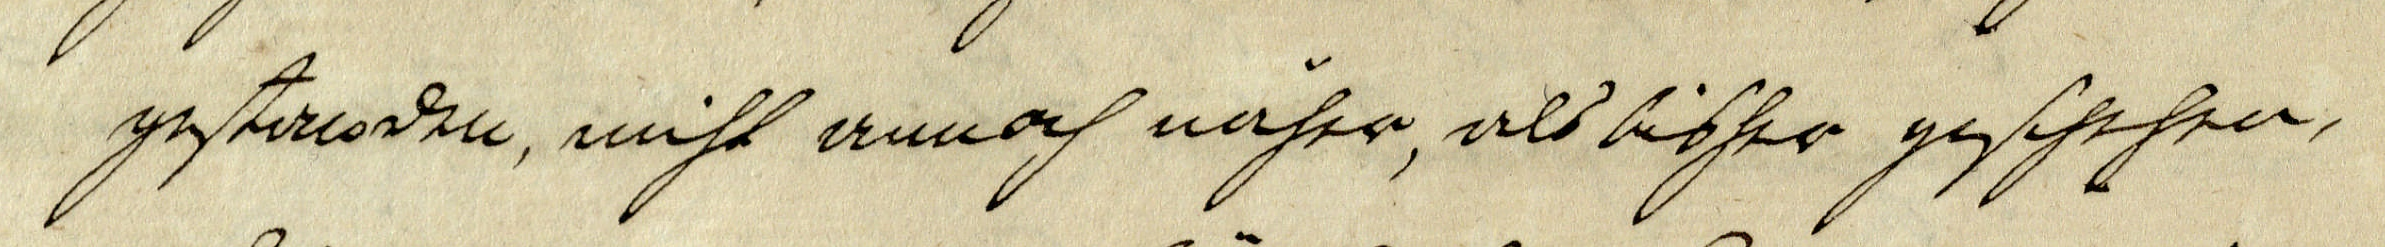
gestanden, nicht annoch näher, als bisher geschehen,
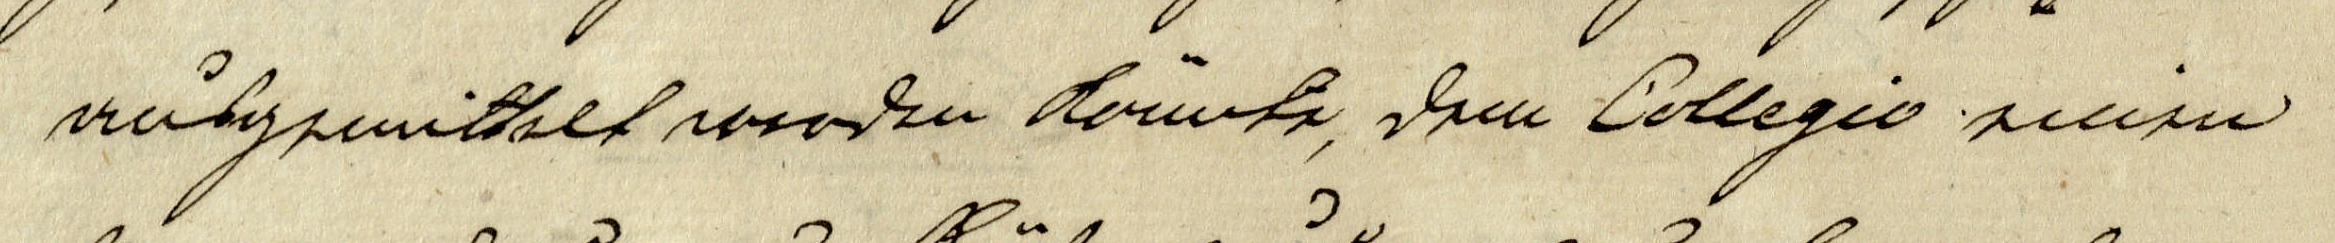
ausgemittelt werden könnte, dem Collegio einen
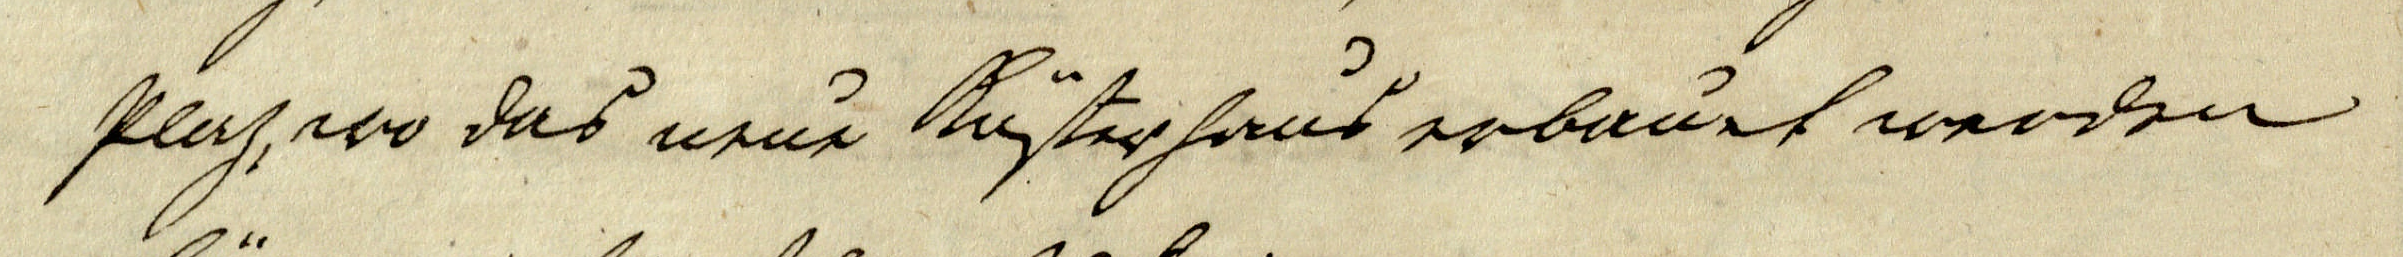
Plaz, wo das neue Küsterhaus erbauet werden
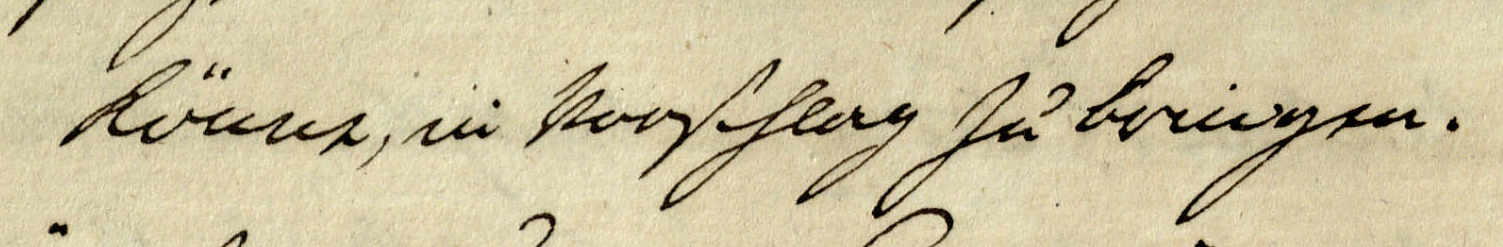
könne, in Vorschlag zu bringen.
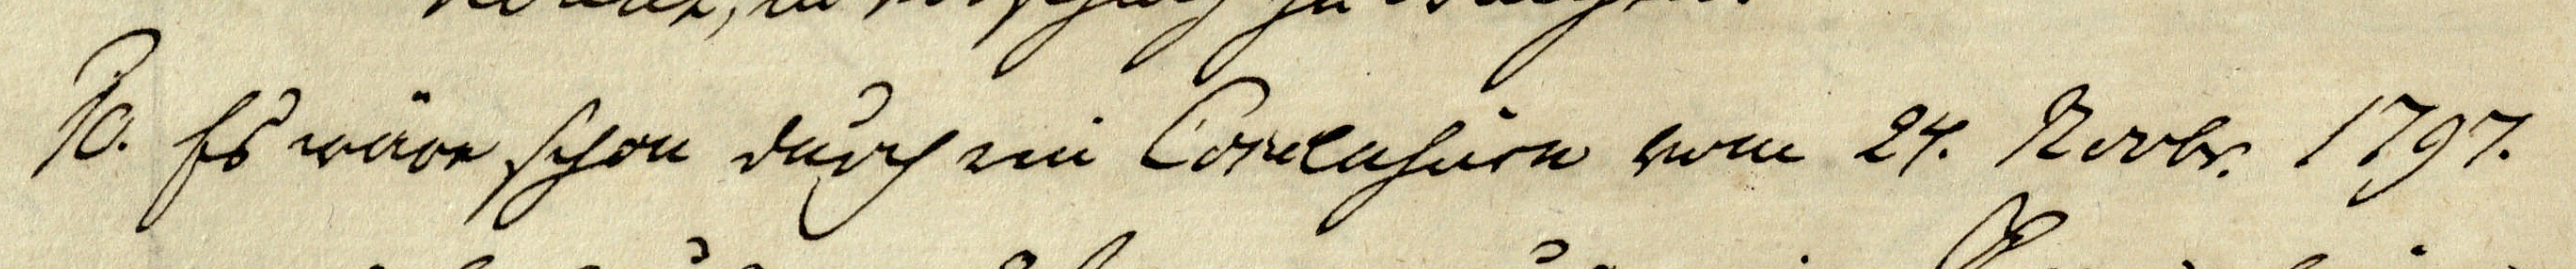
10. Es wäre schon durch ein Conclusum vom 24. Novbr. 1797.
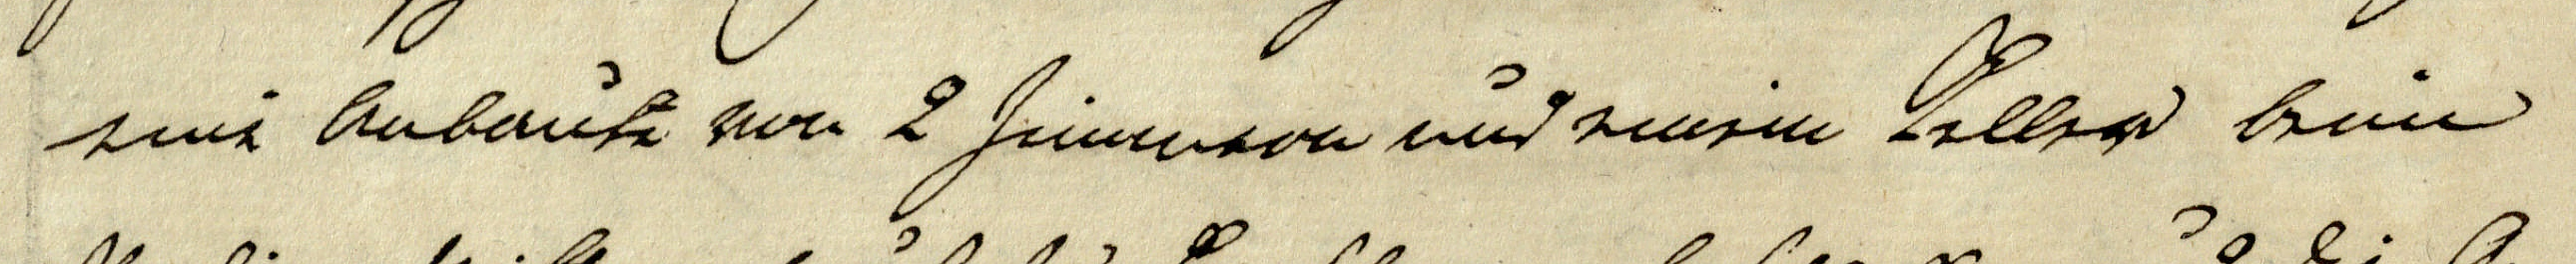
eine Anbaute von 2 Zimmern und einem Keller beim
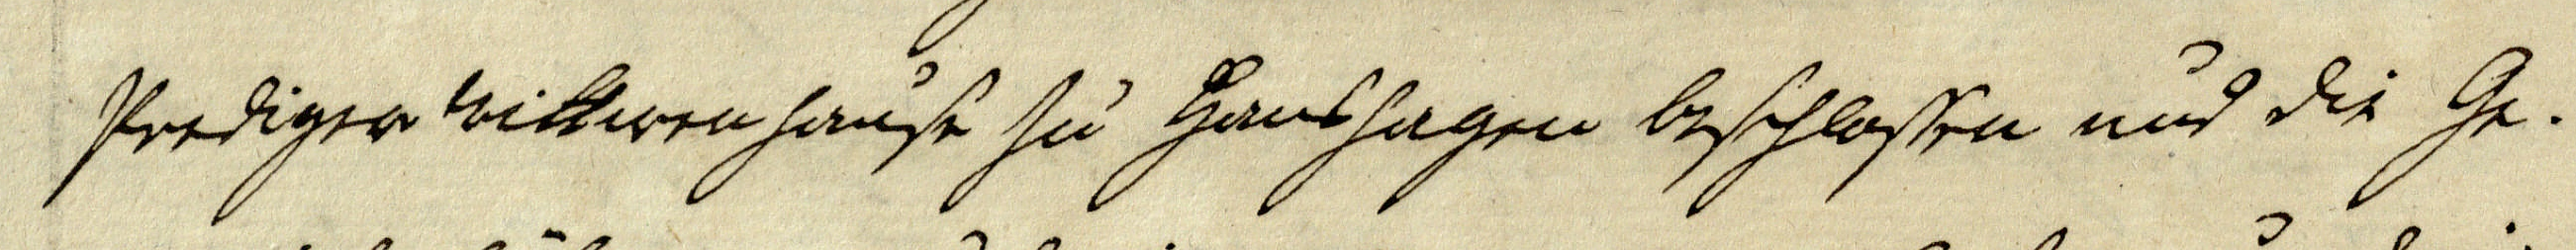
Prediger Wittwenhause zu Hanshagen beschlossen und die Ge¬
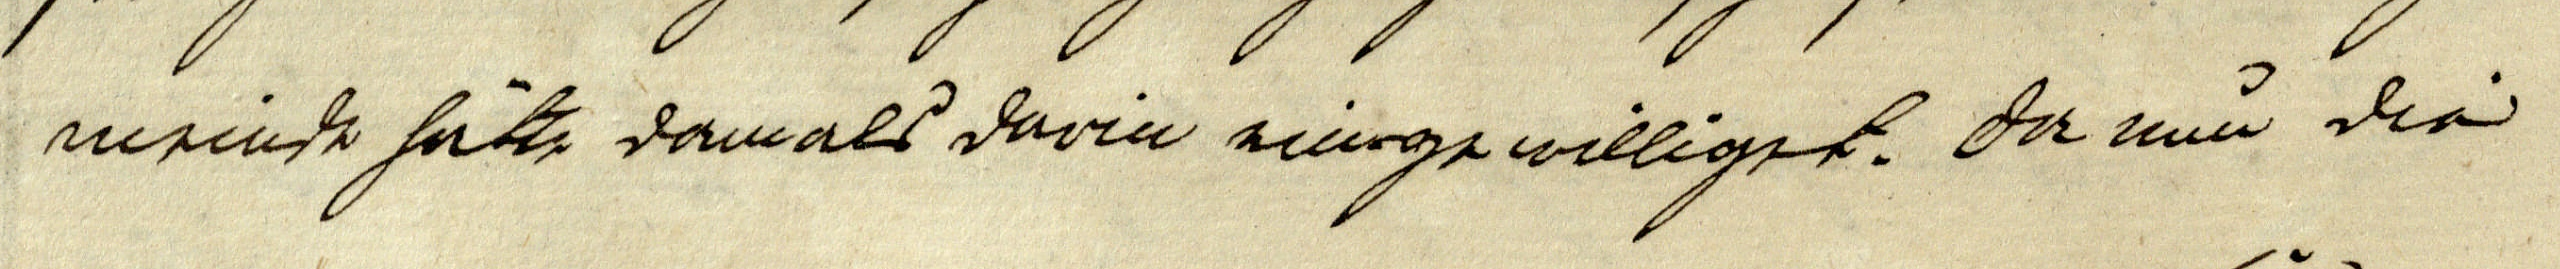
meinde hätte damals darin einigewilliget. Da nun die
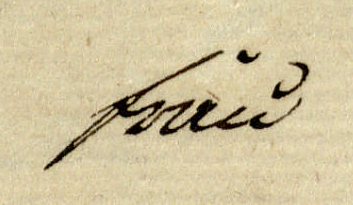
Frau
